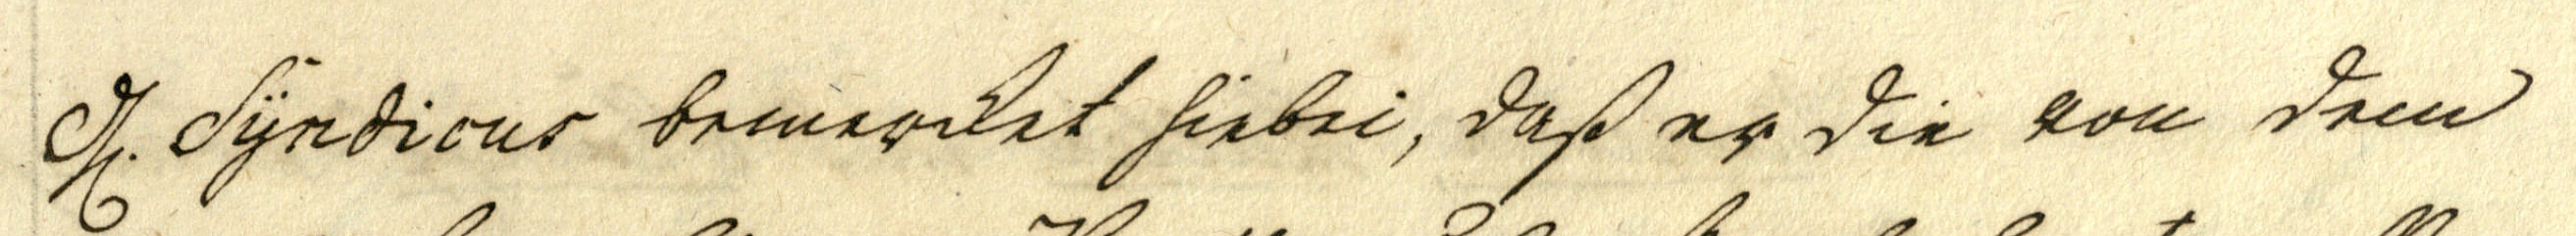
dh. Syndicus bemerket hiebei, daß er die von dem
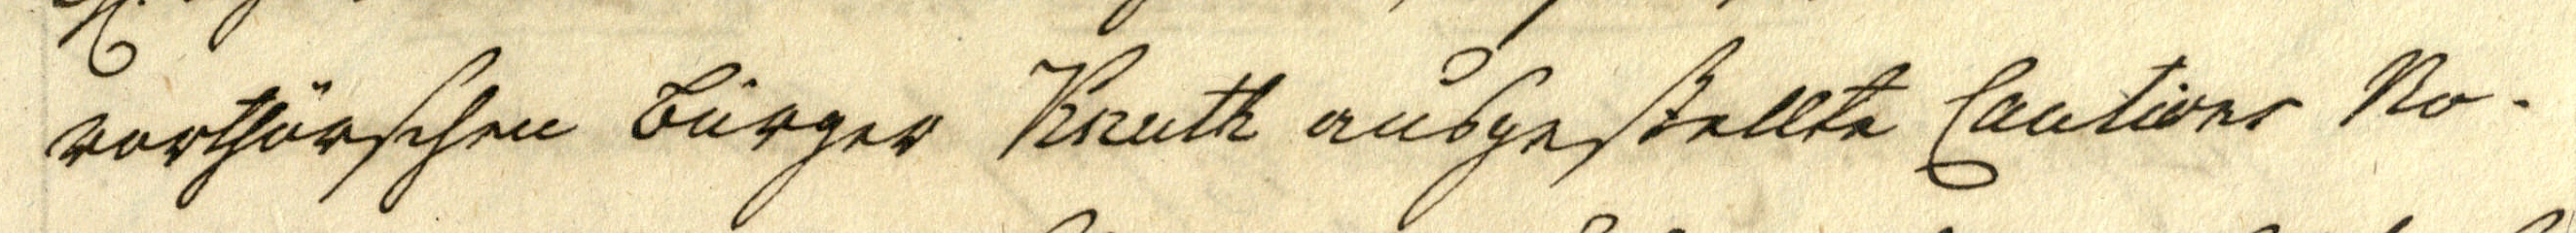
vorthürschen Bürger Knuth ausgestellte Cautions No-
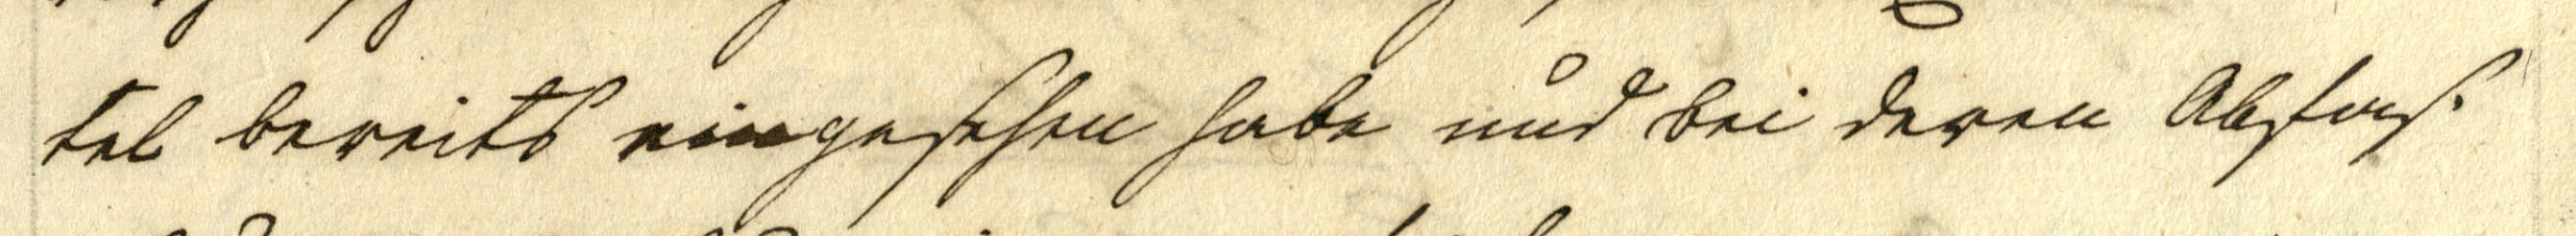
tel bereits eingesehen habe und bei deren Abfas-
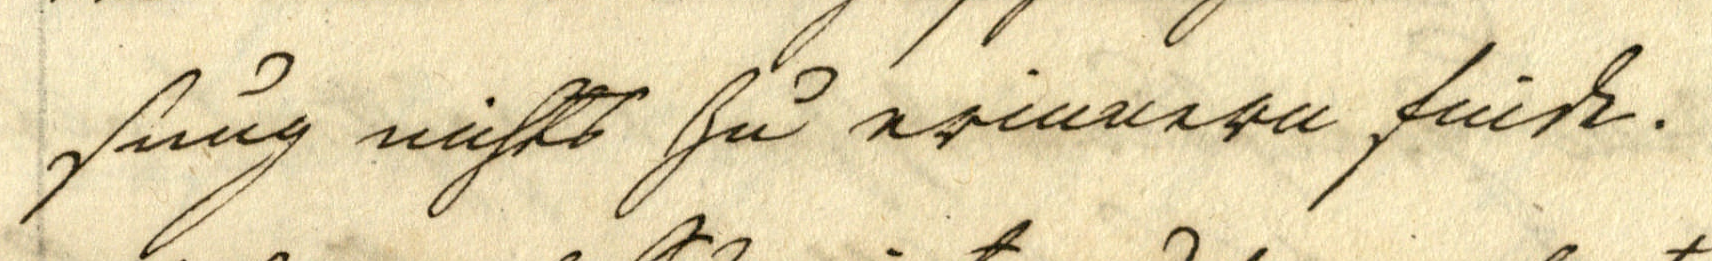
sung nichts zu erinnern finde.
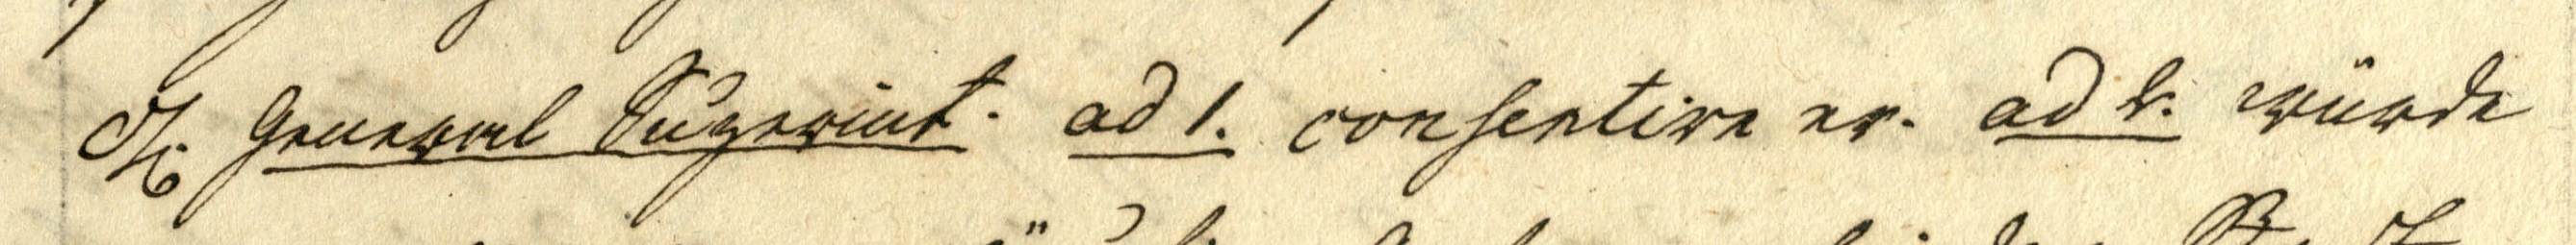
dh. General Superint. ad 1. constire er ad 2. würde
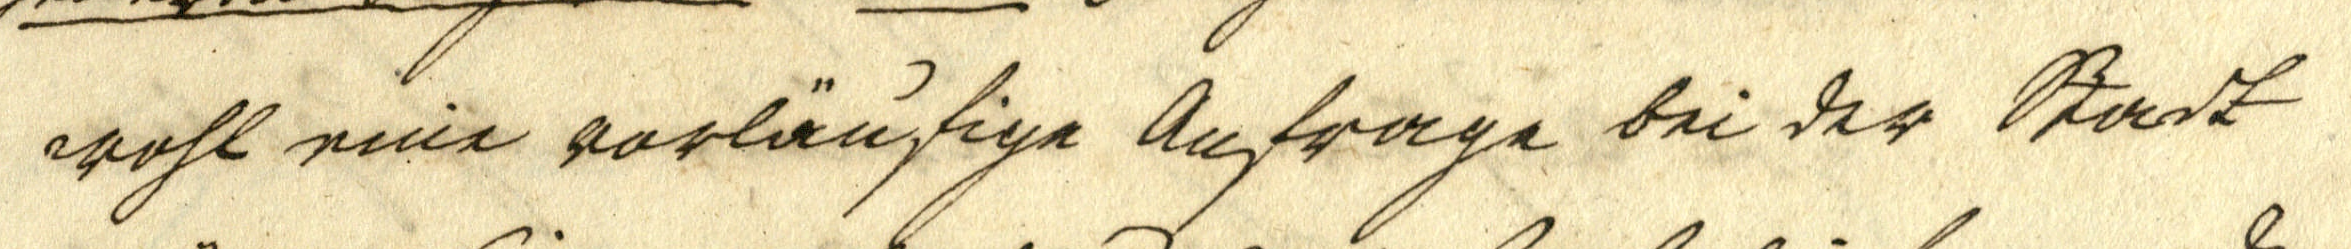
wohl eine vorläufige Anfrage bei der Stadt
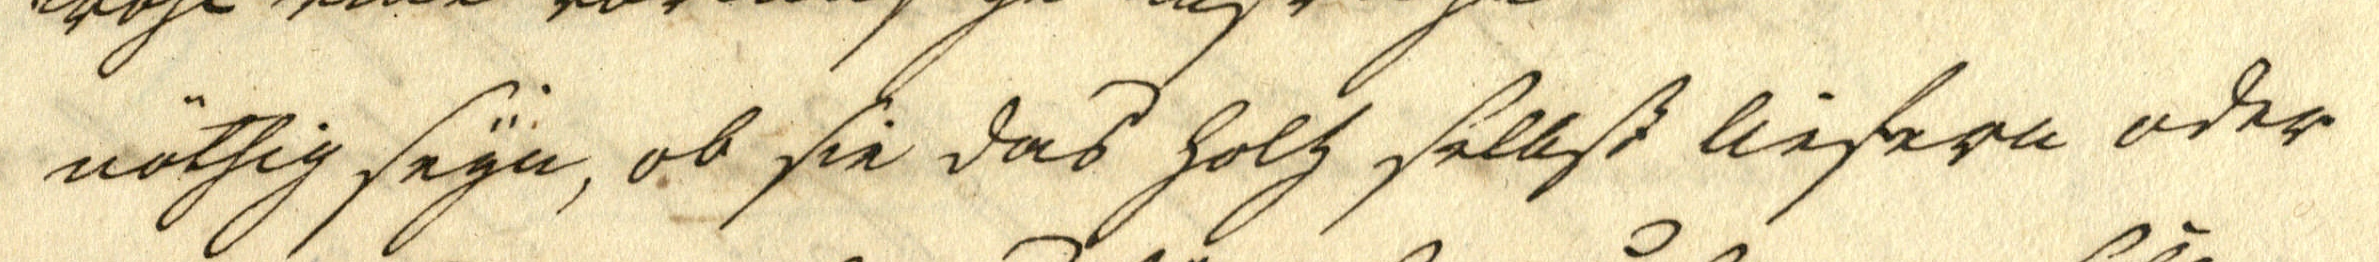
nöthig seyn, ob sie das Holtz selbst liefern oder
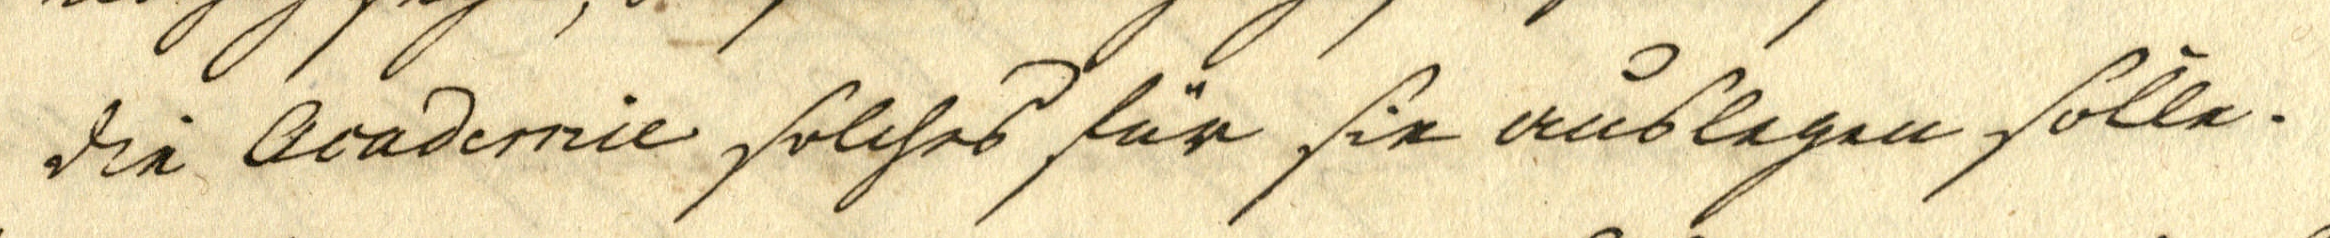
die Academie solches für sie auslegen solle.
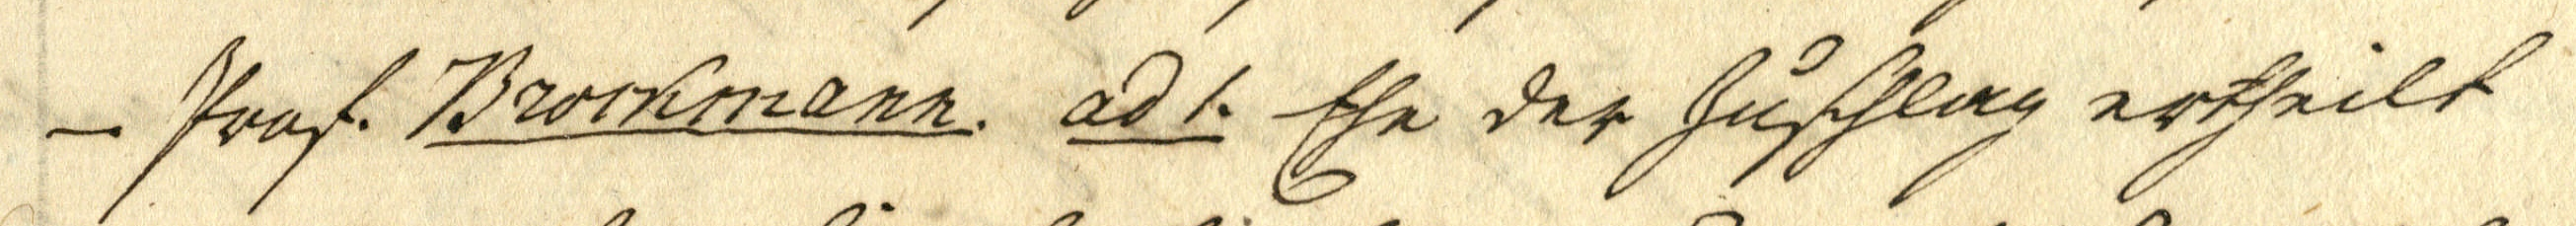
- Prof. Brockmann. ad 1. Ehe der Zuschlag ertheilt
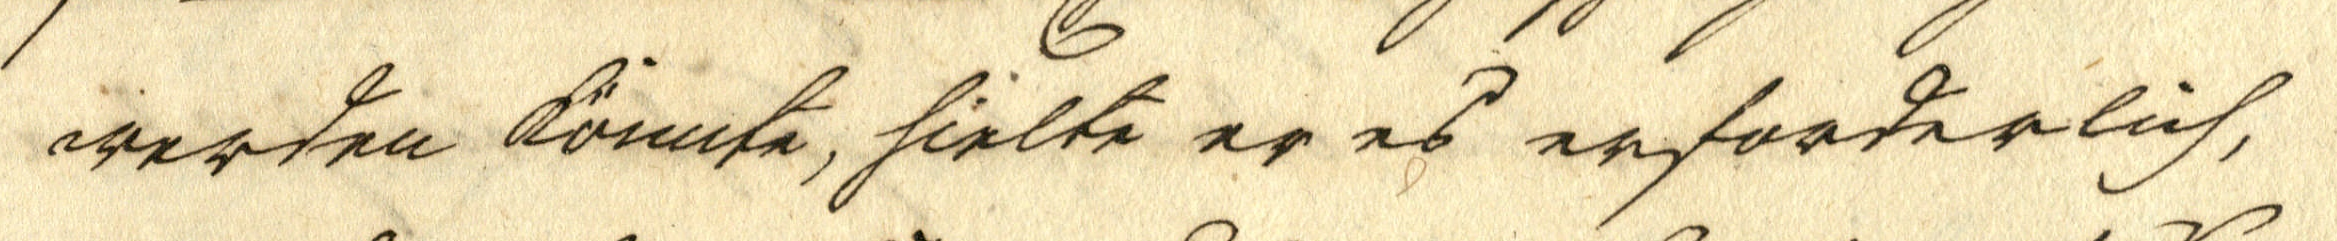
werden könnte, hielte er es erforderlich,
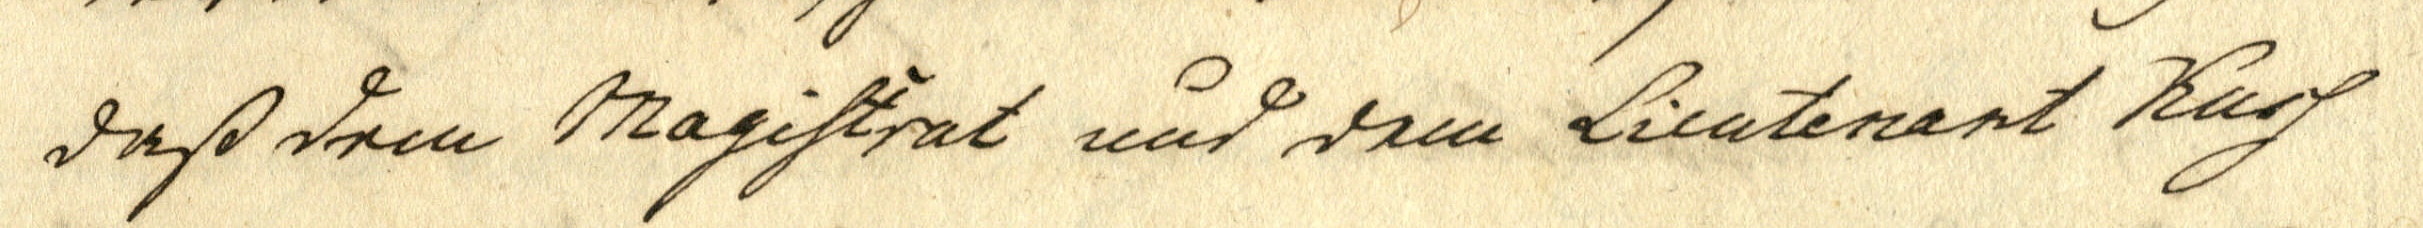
daß dem Magistrat und dem Lieutenant Kuss
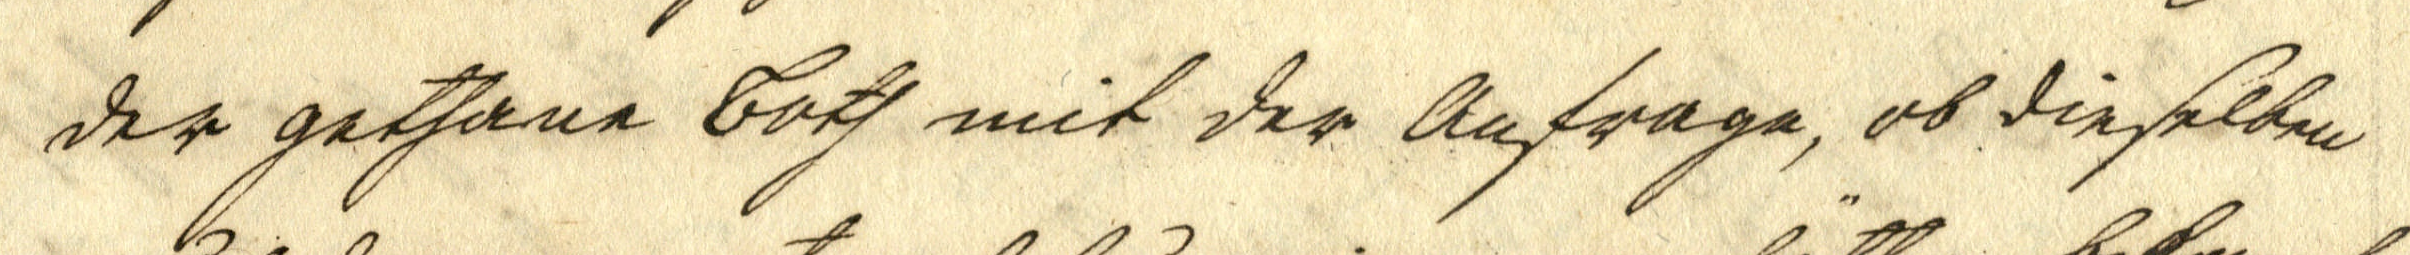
der gethane Both mit der Anfrage, ob dieselben
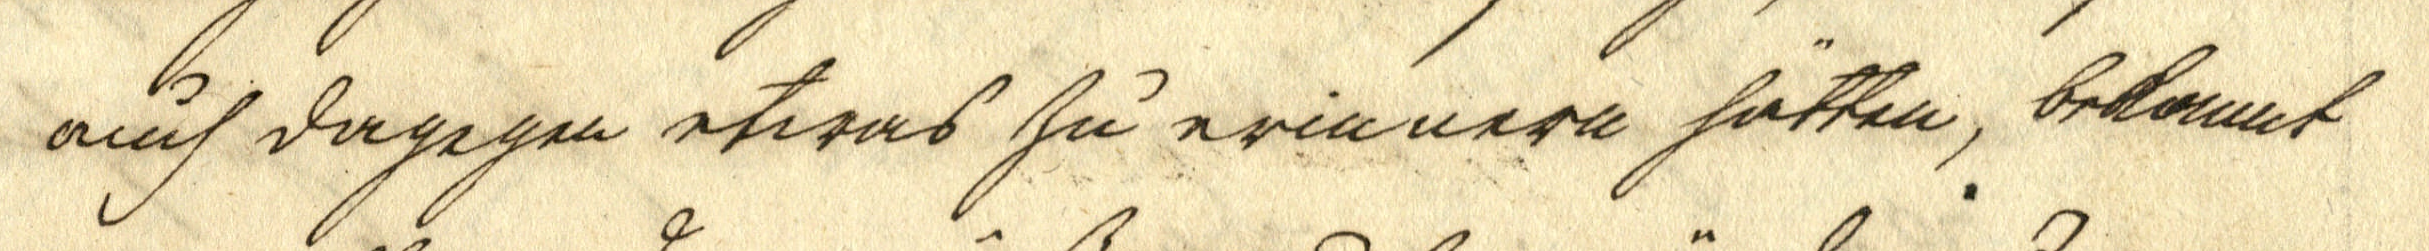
auch dagegen etwas zu erinnern hätten, bekannt
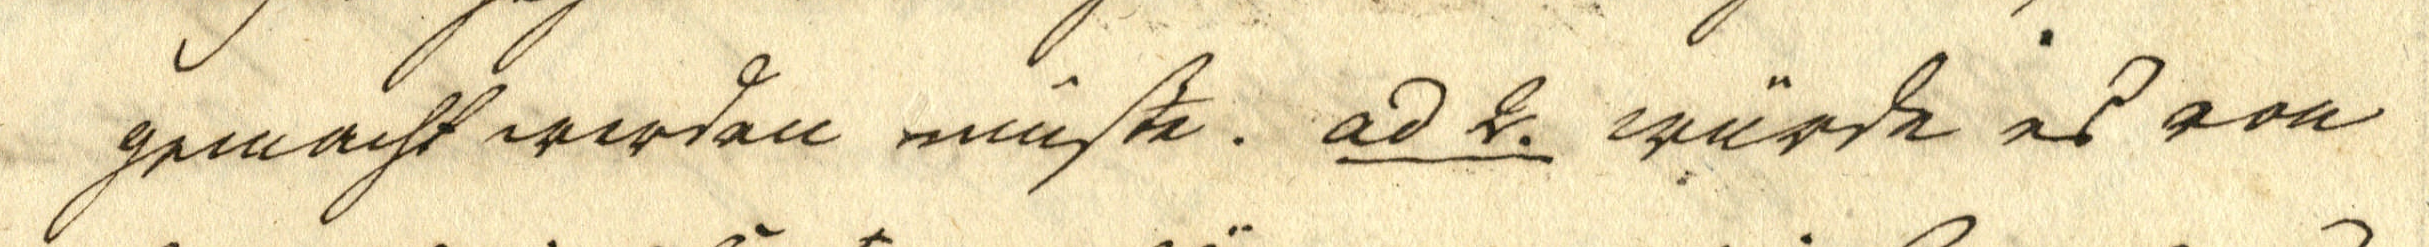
gemacht werden müßte. ad 2. würde es von
